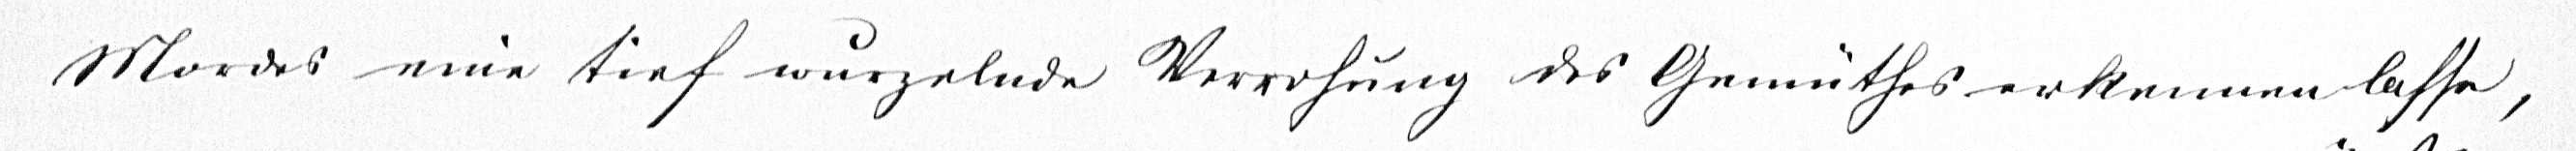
Mordes eine tief wurzelnde Verrohung des Gemüthes erkennen lasse,
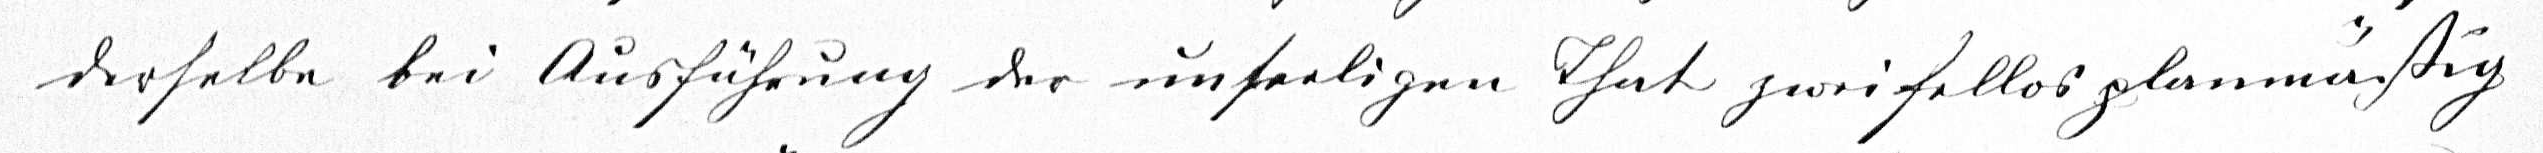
derselbe bei Ausführung der unsxxligen That zweifellos planmäßig
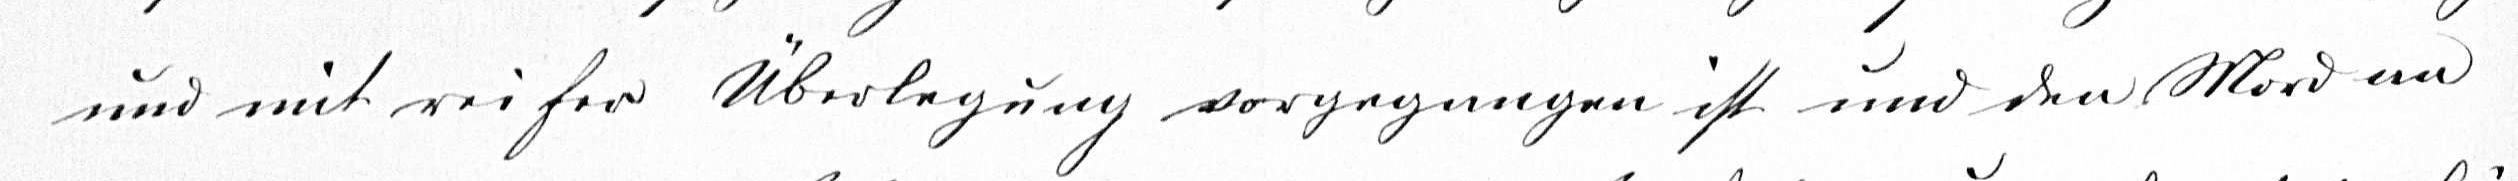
und mit reifer Überlegung vorgegangen ist und den Mord an
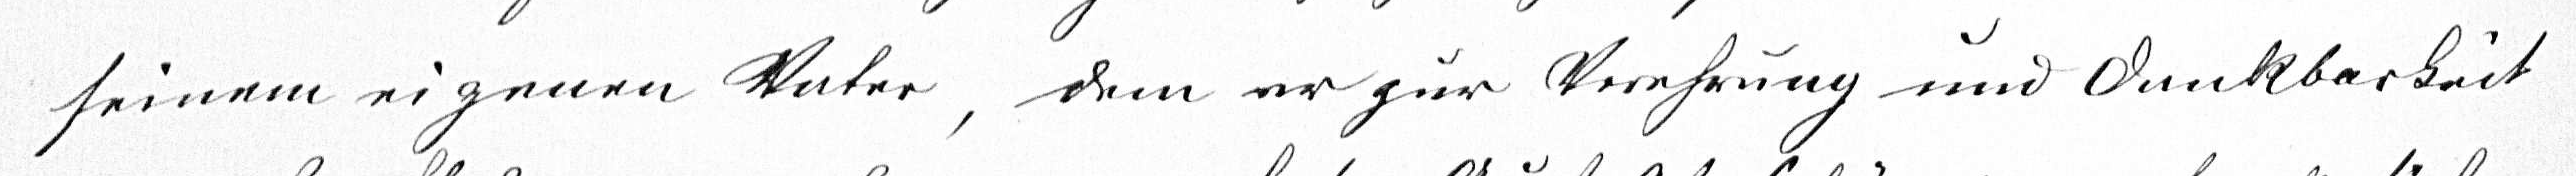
seinem xx Vater, dem er zur Verehrung und Dankbarkeit
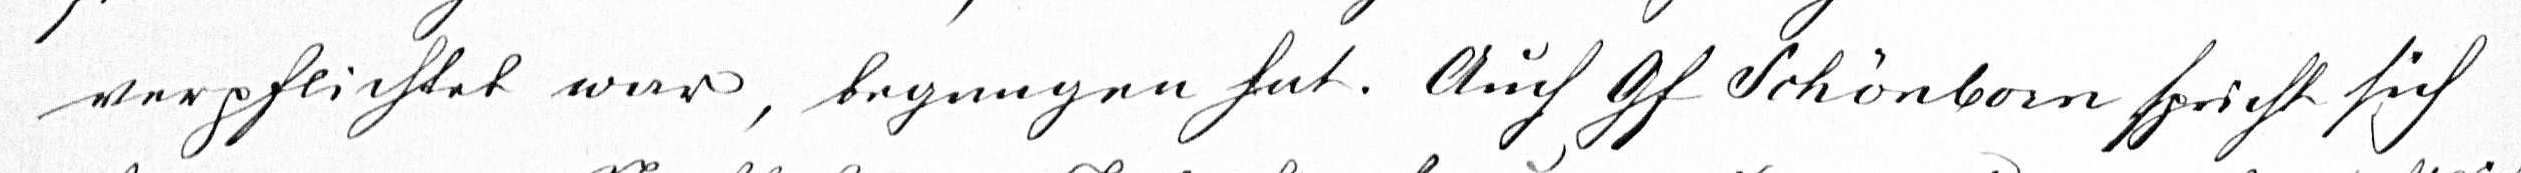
verpflichtet war, begangen hat. Auch Gf Schönborn spricht sich
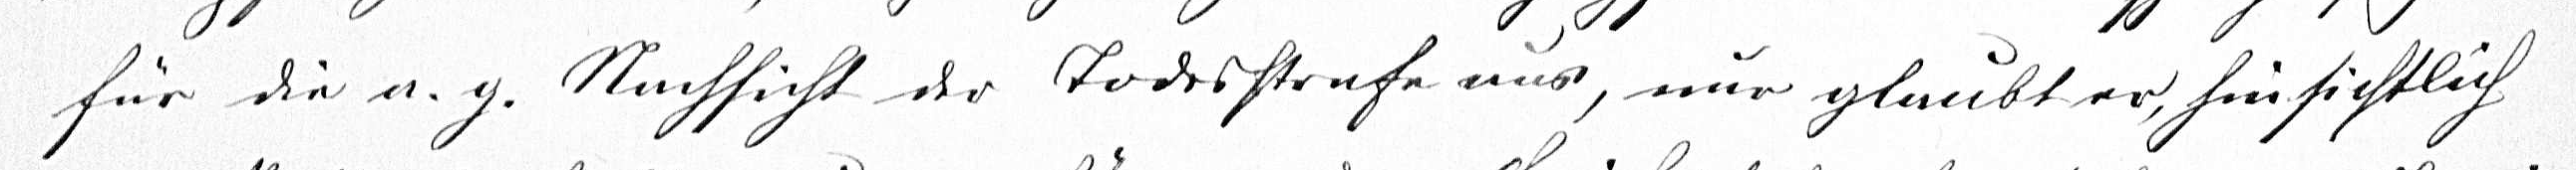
für die a. g. Nachsicht der Todesstrafe aus, nur glaubt er, hin sichtlich
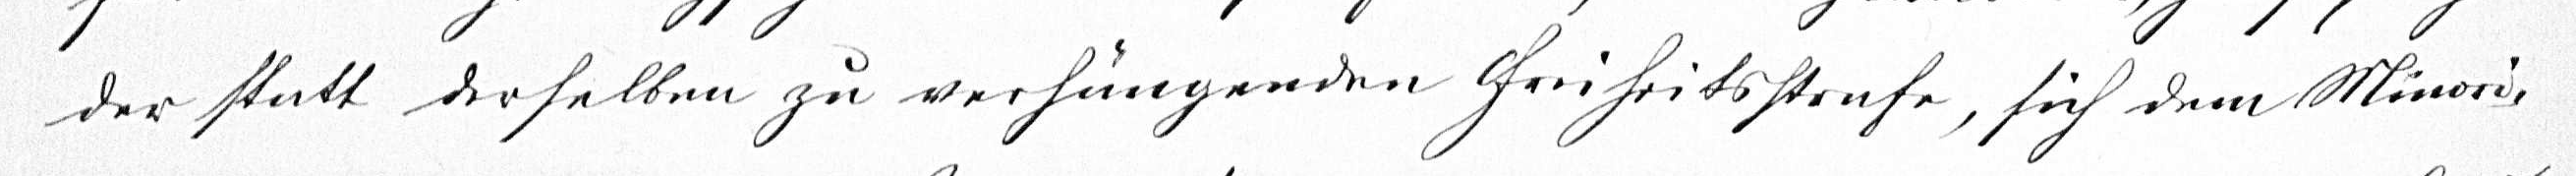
der statt derselben zu verhängenden Freiheitsstrafe, sich dem Minori¬
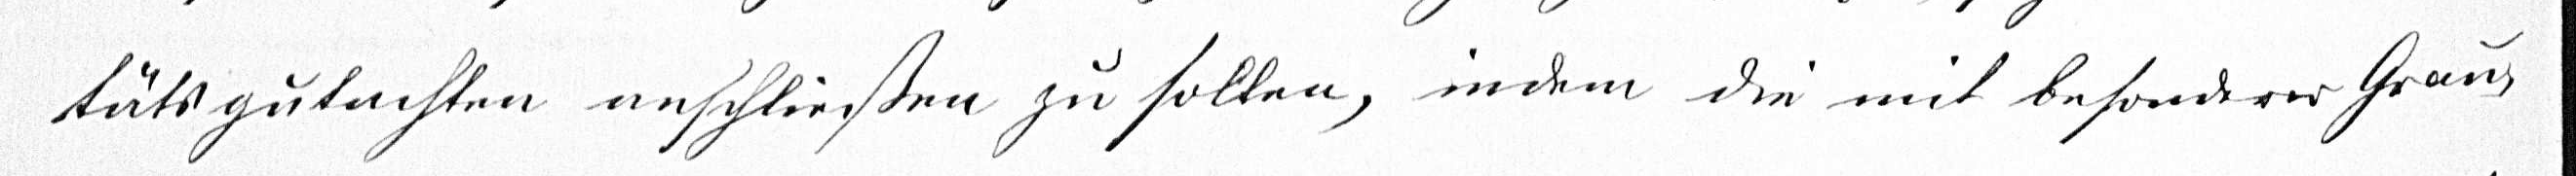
täts gutachten anschließen zu sollen, indem die mit besonderer Grau¬
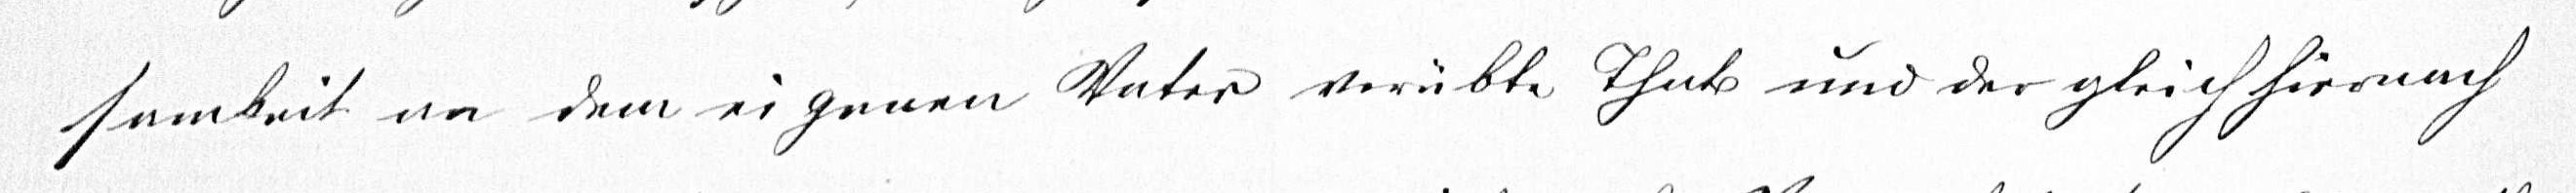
samkeit an dem eigenen Vater verübte That und der gleich hiernach
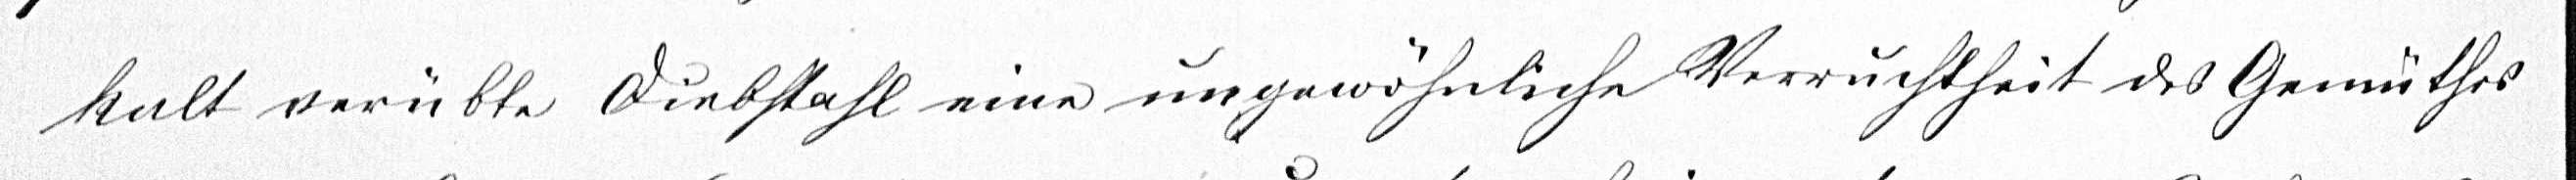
kalt verübte Diebstahl eine ungewöhnliche Verruchtheit des Gemüthes
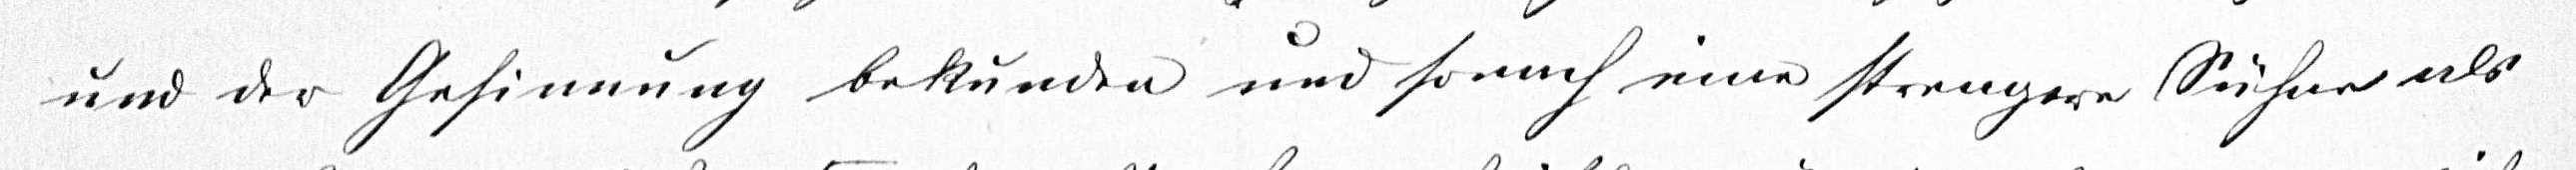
und der Gesinnung bekunden und so auch eine strengere Sühne als
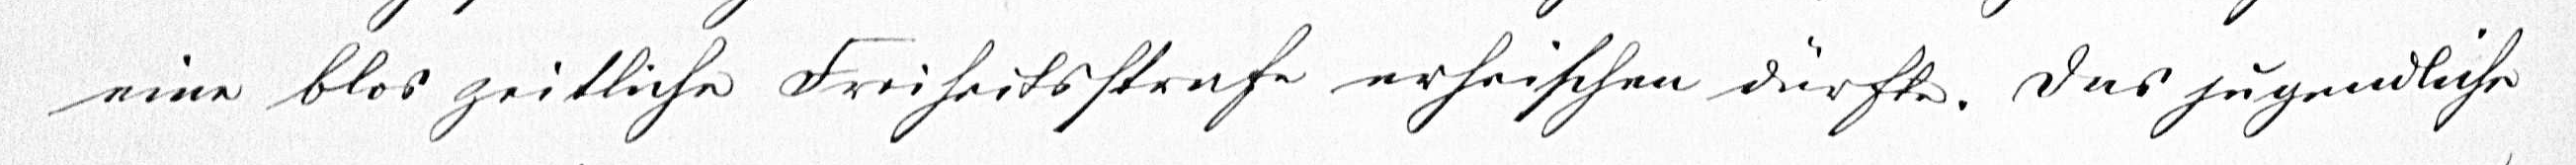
eine blos zeitliche Freiheitsstrafe erheischen dürfte. Das jugendliche
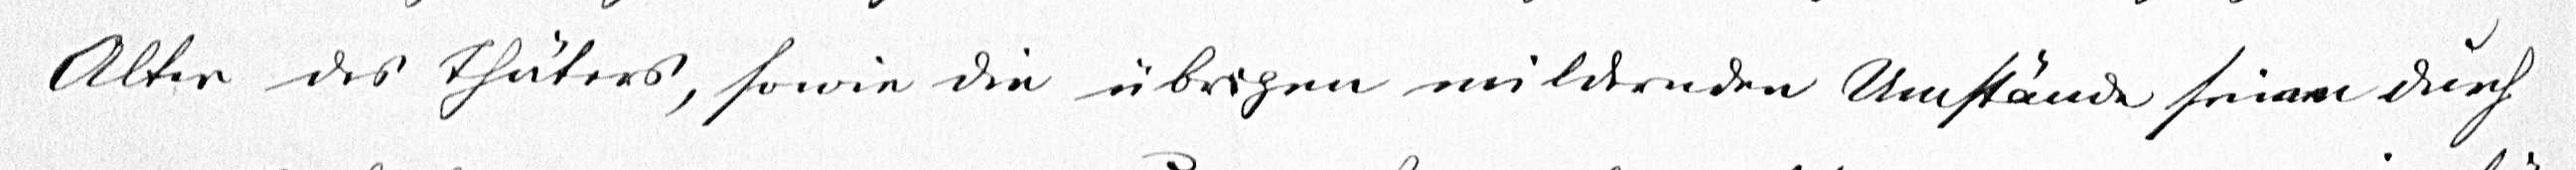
Alter des Thäters, sowie die übrigen mildenden Umstände seixx durch
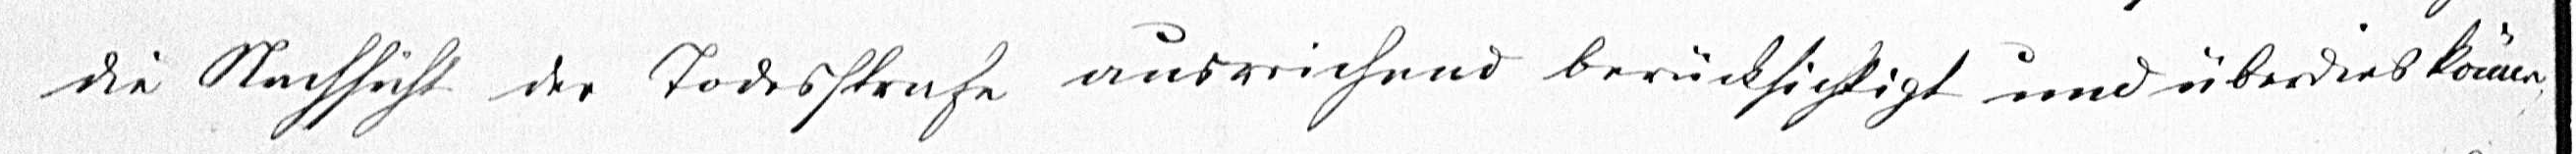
die Nachsicht der Todesstrafe ausreichend berücksichtigt und überdies könne
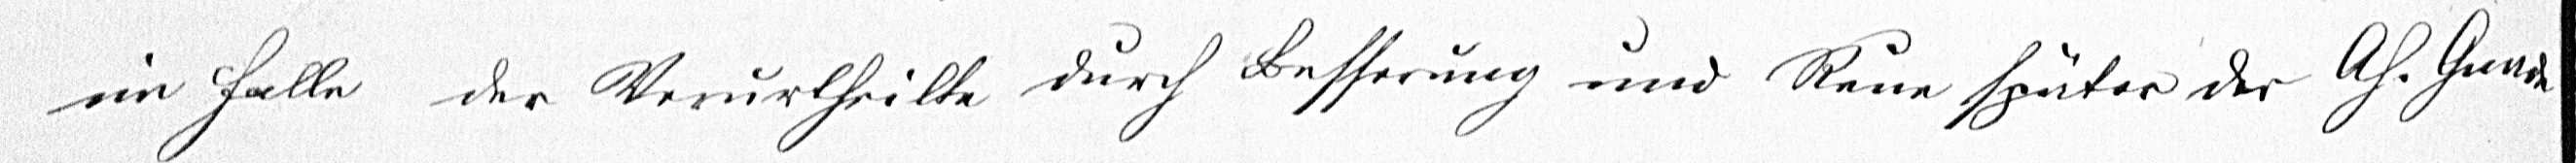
im Falle der Verurtheilte durch Besserung und Reue später der Ah. Gunde
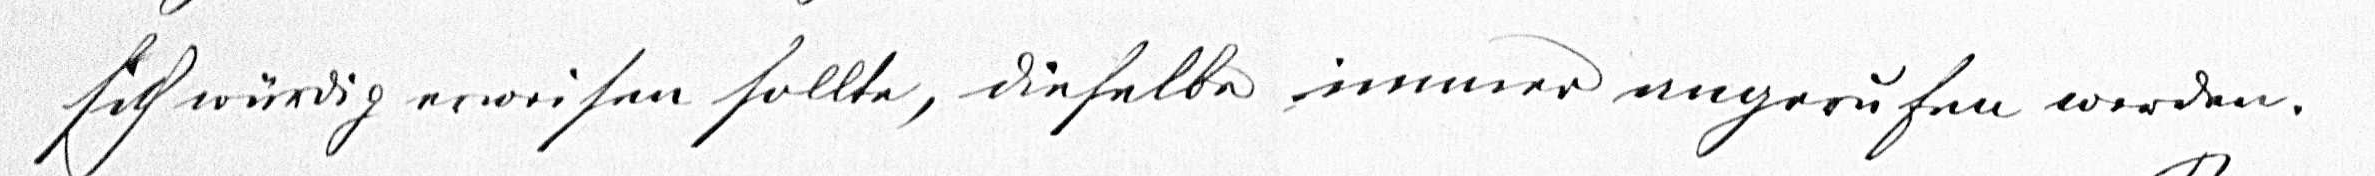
sich würdig erweisen sollte, dieselbe immer angerufen werden.
